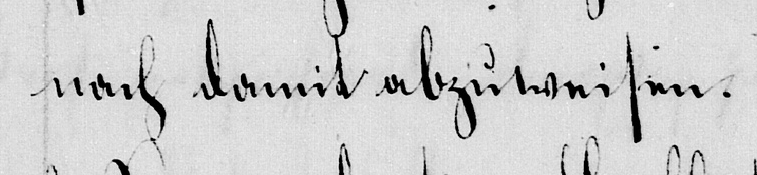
nach damit abzuweisen.
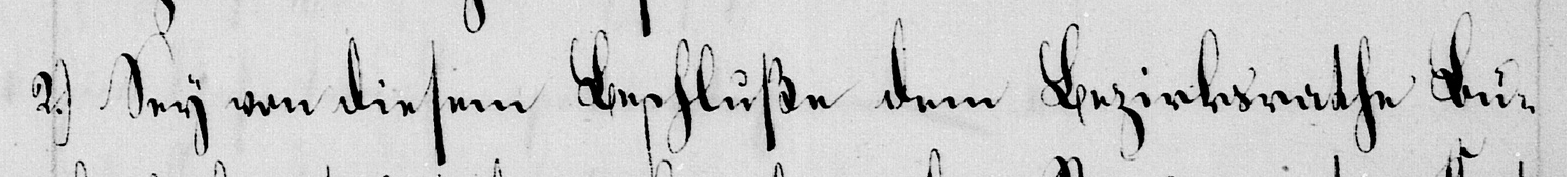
2.) Sey von diesem Beschluße dem Bezirksrathe Bü¬
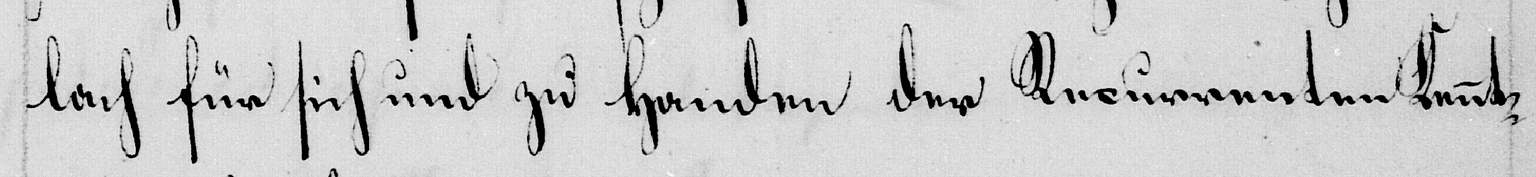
lach für sich und zu Handen der Recurrenten Kennt¬
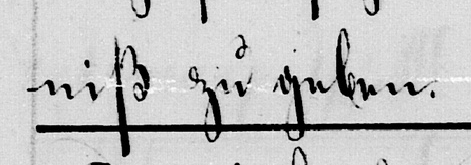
niß zu geben.
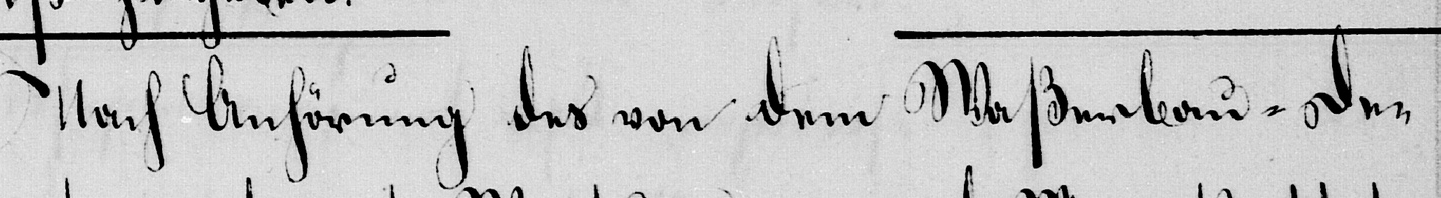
Nach Anhörung des von dem Waßerbau-De¬
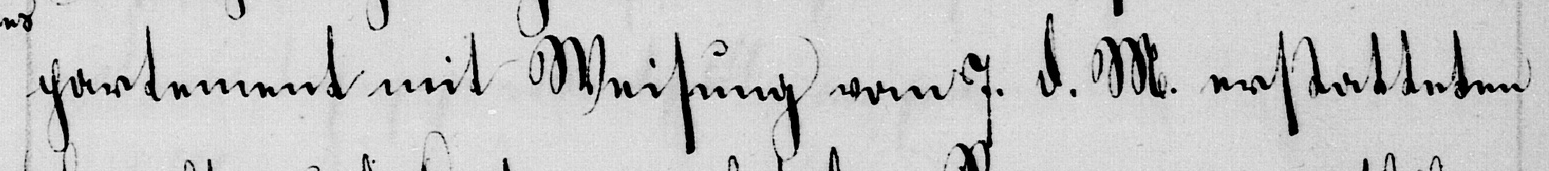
partement mit Weisung vom 7. d. M. erstatteten
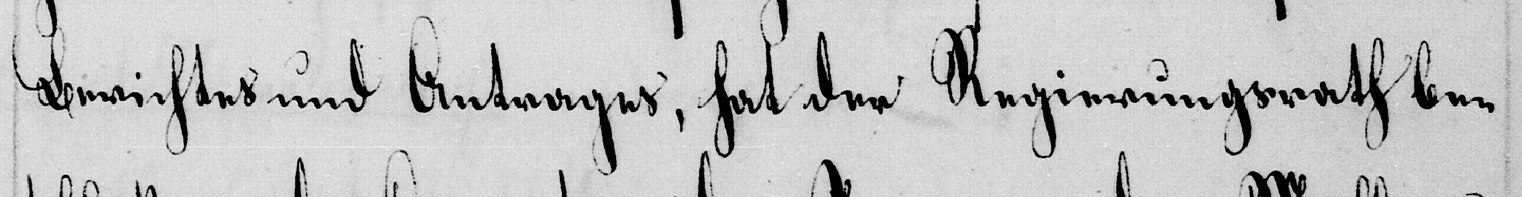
Berichtes und Antrages, hat der Regierungsrath be¬
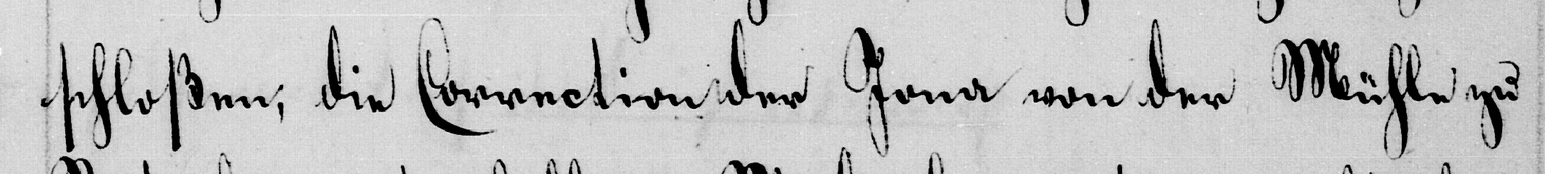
schloßen, die Correction der Jona von der Mühle zu
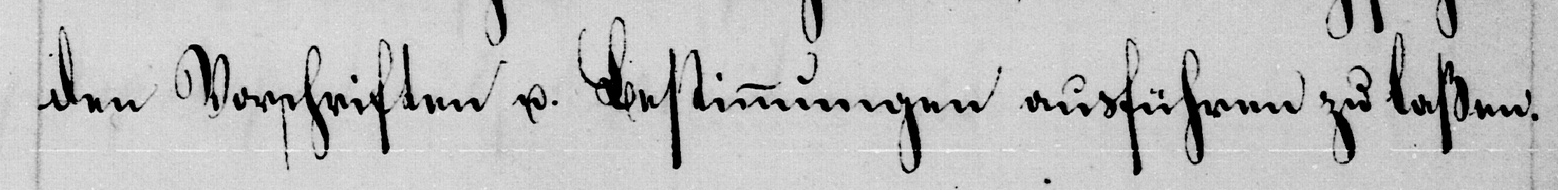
den Vorschriften u. Bestimmungen ausführen zu laßen.
